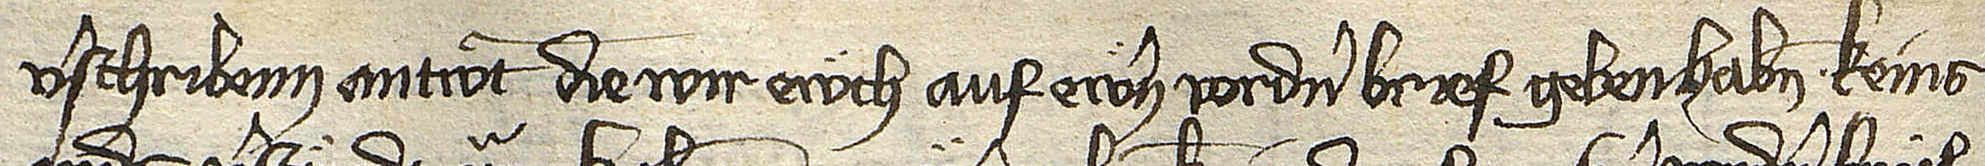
v*ſchribnn antw*t die wir eẅch auf eẅ*n vordn* brief geben habn . keins
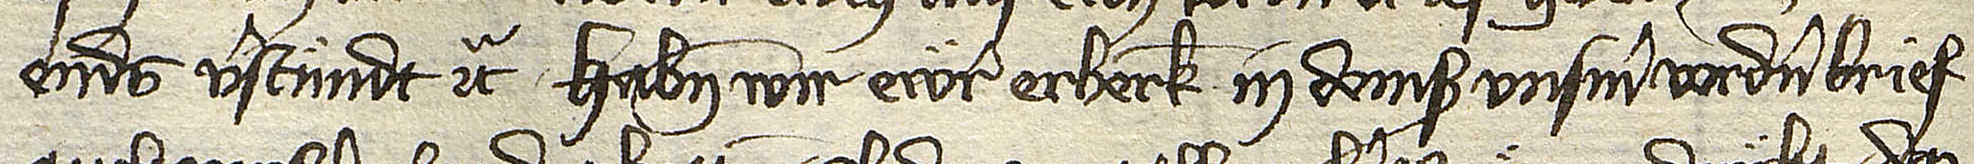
ends v*ſtündt ec* / Habn* wir eẅr* erberk* in demſ* vnſm* vordn* brief
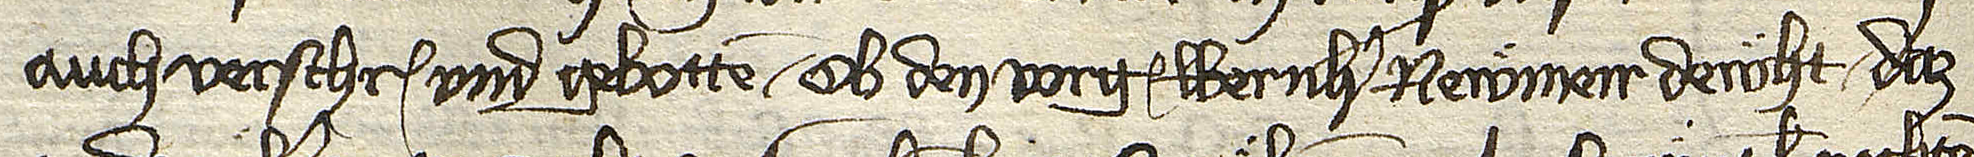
auch verſchr* vnd gebotte* / Ob den vorg* Wernh* Neẅmeir deẅht / daʒ
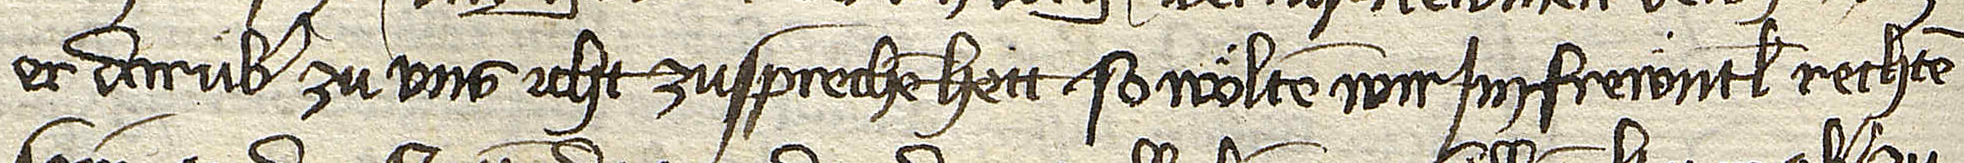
er darüb* ʒu vns icht ʒuſpreche* hett / ſo wölte* wir Im freẅntl* rechte*
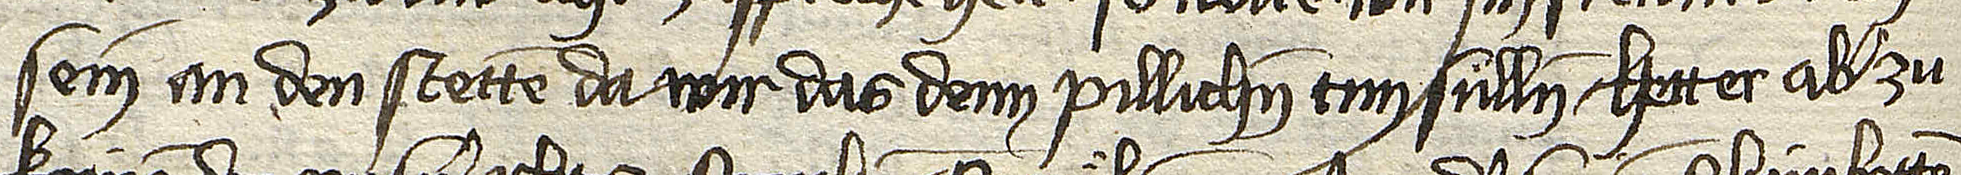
ſein an den ſtette* da wir das denn pillichn* tun ſülln* / hett er ab* ʒu
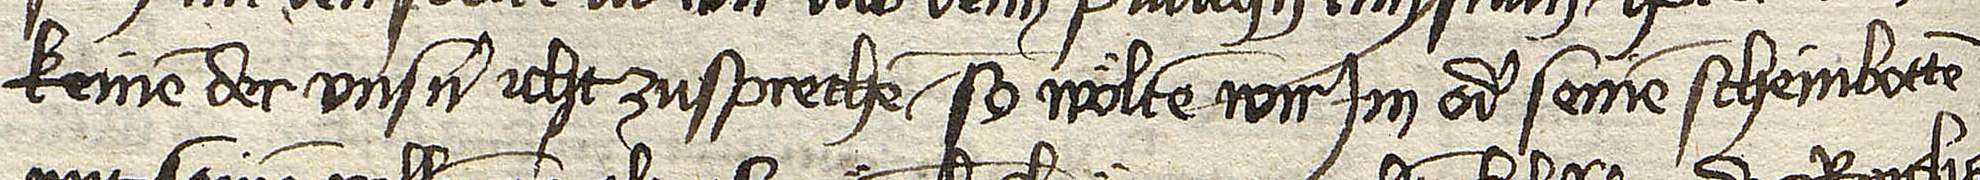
keine* der vnſn* icht ʒuſpreche* / ſo wölte* wir Im od* ſeine* ſcheinbotte*
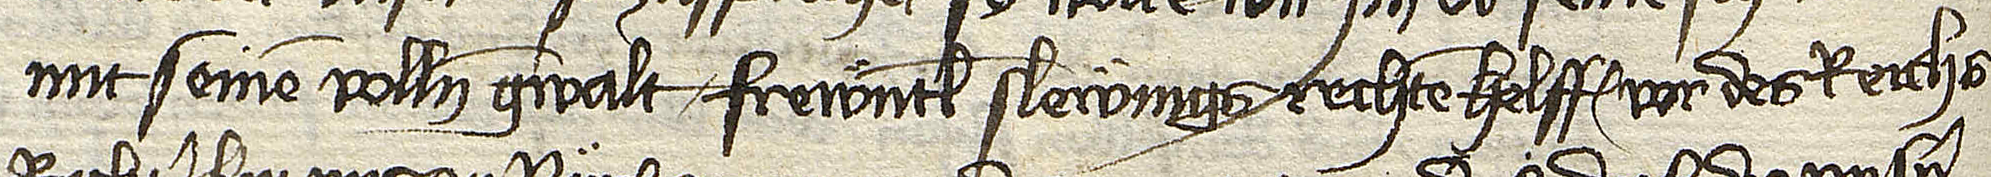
mit ſeine* volln* gwalt / freẅntl* ſleẅnigs rechte* helff* vor des Reichs
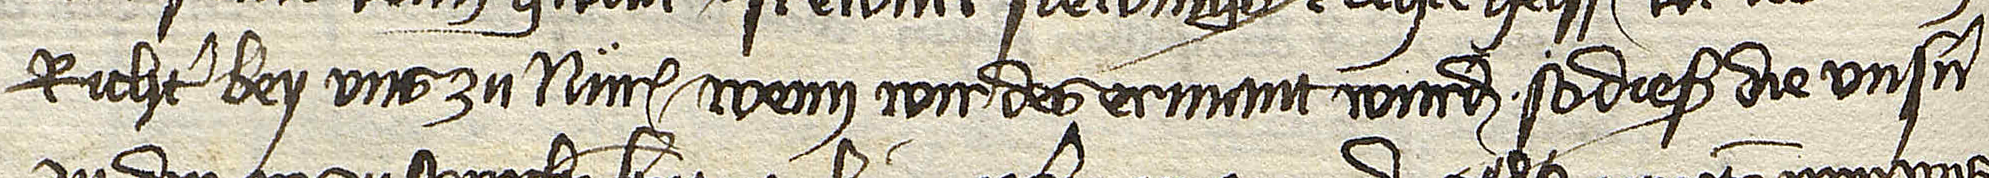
Richt* bey vns ʒu Nür* / wenn wir des ermant wurd* . ſo dieſ* die vnſn*
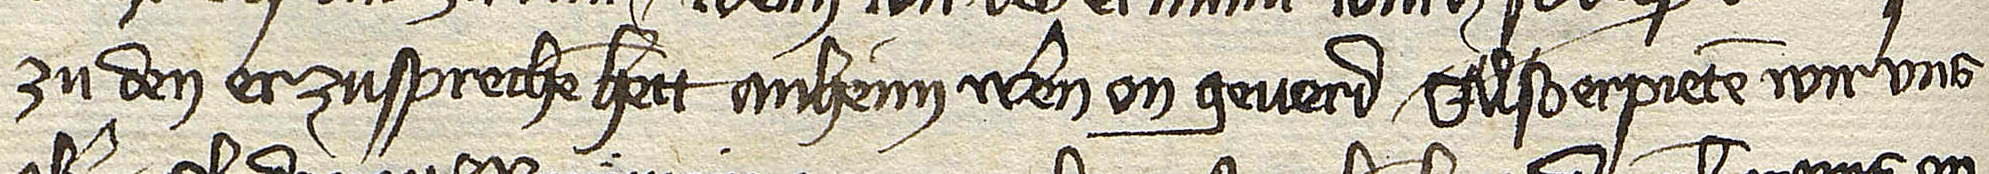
ʒu den er ʒuſpreche* hett anheim w*en on geuerd / Alſo erpiete* wir vns
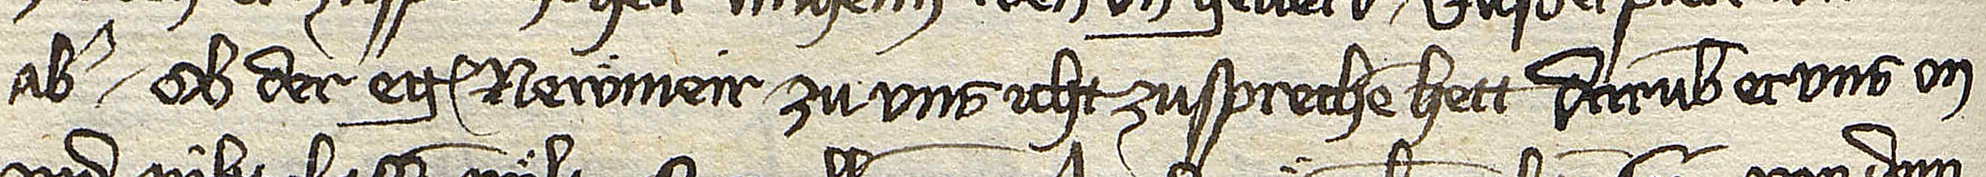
ab* / Ob der eg* Neẅmeir / ʒu vns icht ʒuſpreche* hett Darub* er vns on
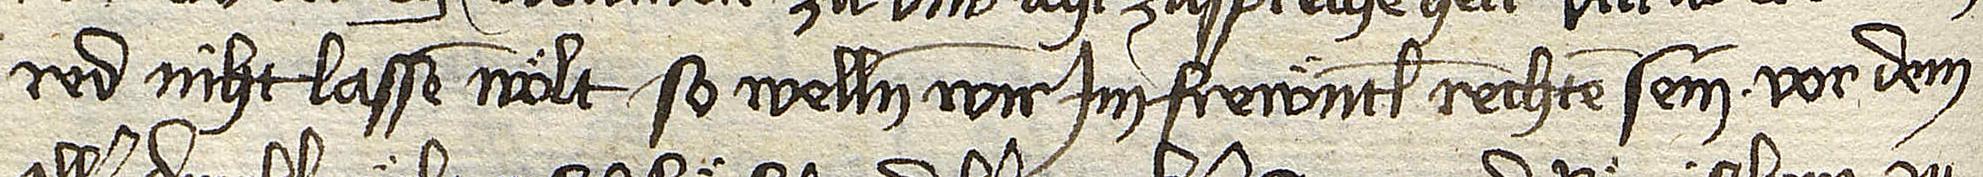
red niht laſſe* wölt / ſo welln* wir Im freẅntl* rechte* ſein . vor dem
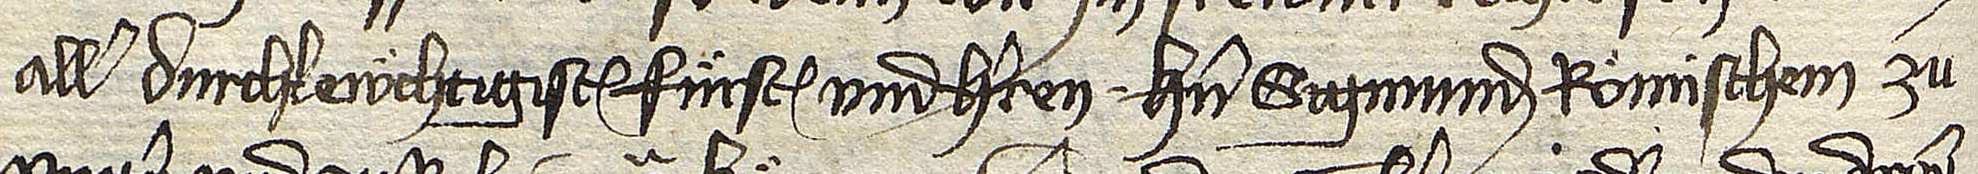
all* durchleẅchtigiſt* fürſt* vnd h*ren . Hn* Sigmund* Römiſchem ʒu
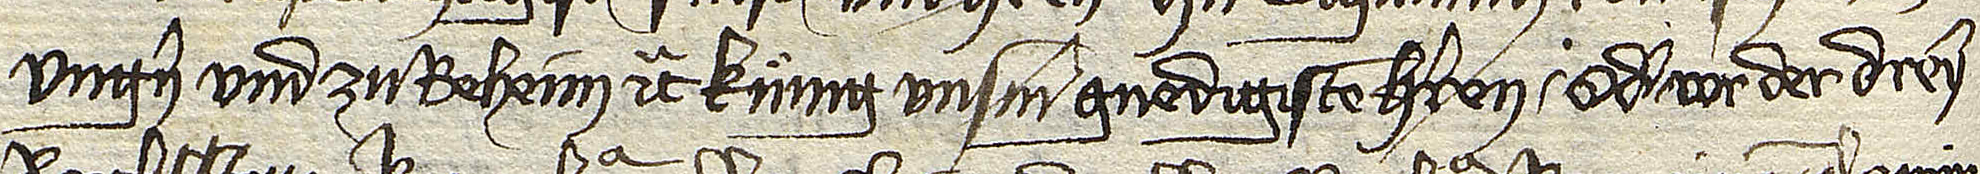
Vng*n vnd ʒu Beheim ec* künig vnſm* gnedigiſte* h*ren / Od* vor der drey*
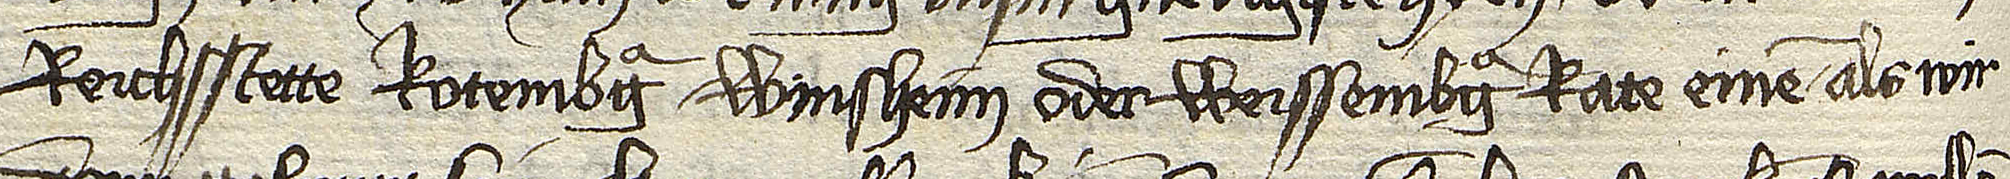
Reichſſtette Rotemb*g / Winſheim oder Weiſſemb*g Rate eine* / als wir
